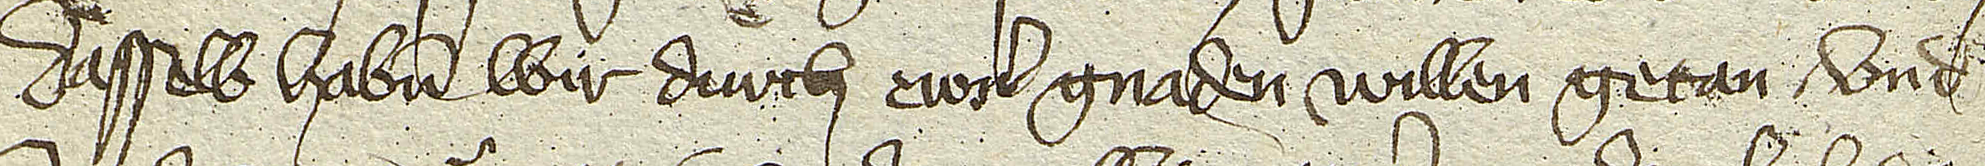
Daſſelb habn* wir durch ewr* gnaden willen getan / vnd
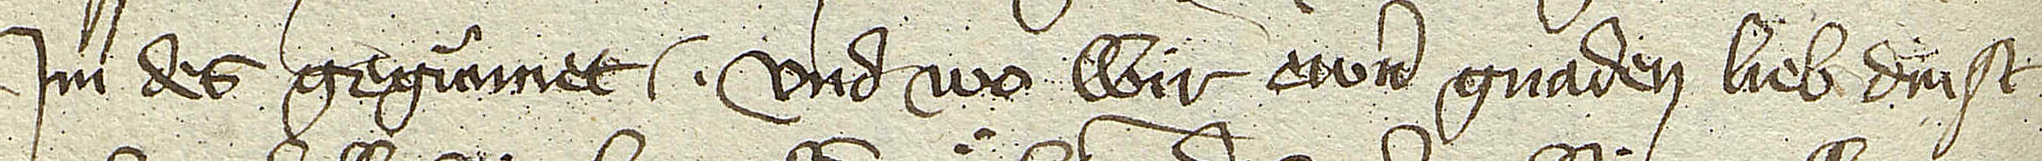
Im des gegünnet / . vnd wo wir ewn* gnaden lieb dinſt
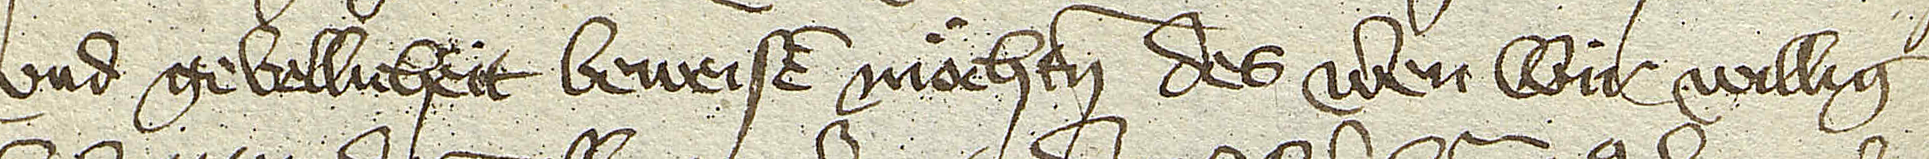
vnd gevellicheit beweiſe* möchtn* Des w*en wir willig
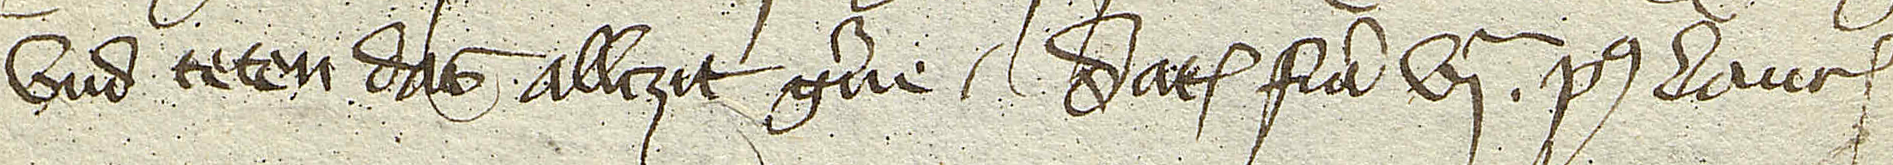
vnd teten das allcʒeit g*ne / Dat* fia* vi* . p* laur*
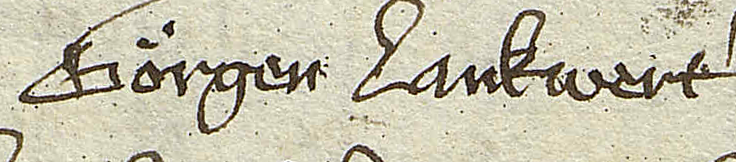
Görgen Lankwert*
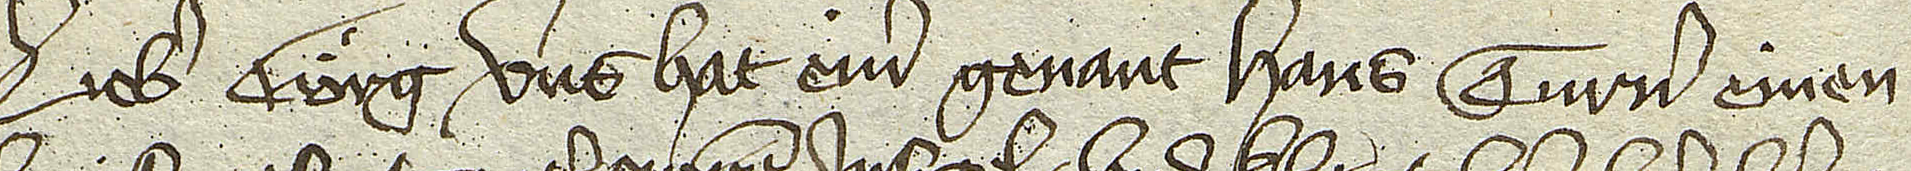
Lieb* Görg / Vns hat ein* genant Hans Turn* einen
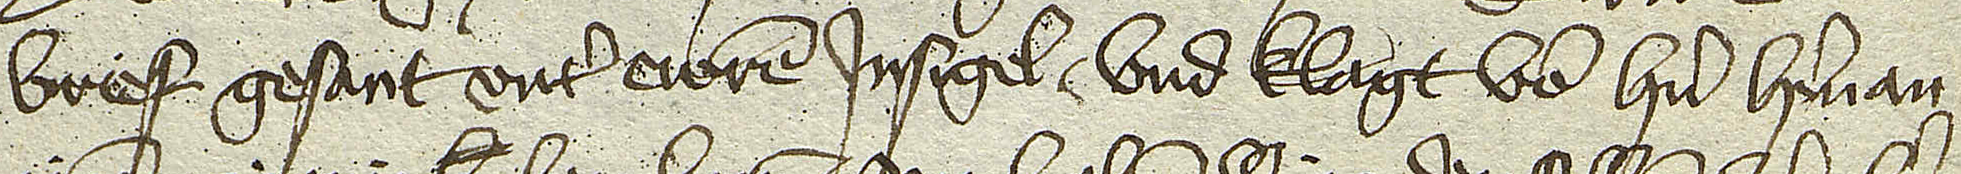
brief geſant vnt* ewre* Inſigel / vnd klagt vo* hn* h*man
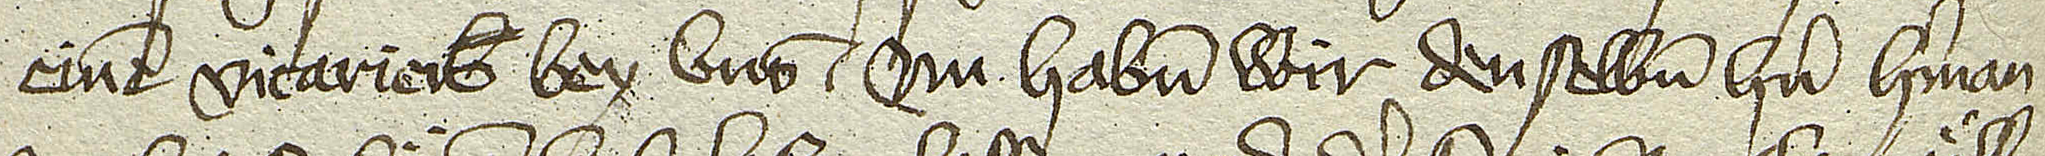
eine* vicariers bey vns / Nu habn* wir denſelbn* hn* h*man
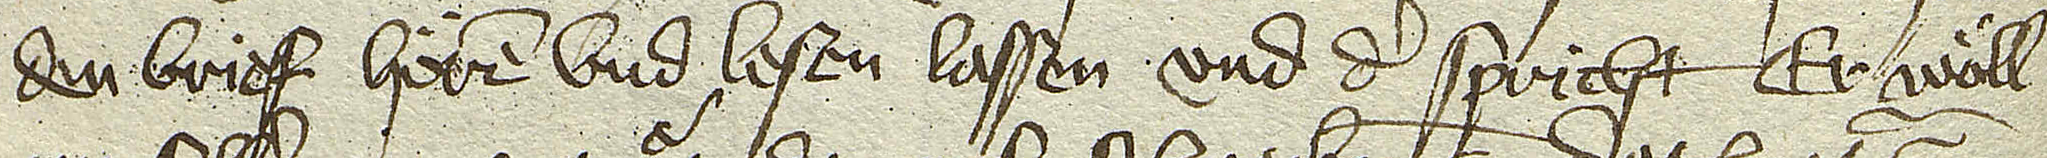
den brief höre* vnd leſen laſſen vnd d* ſpricht Er wöll
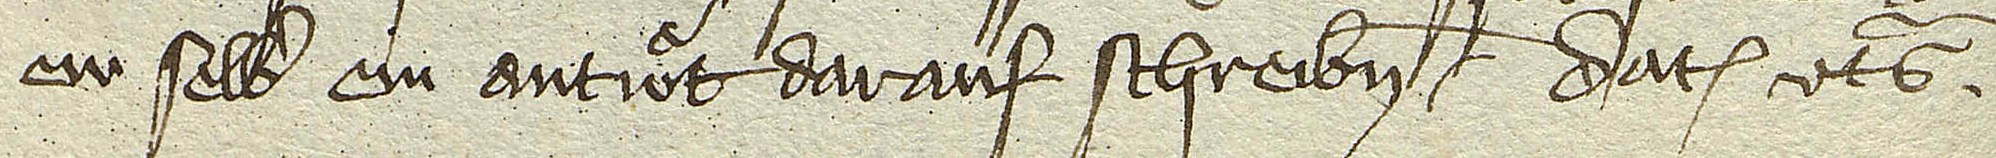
ew ſelb ein antwt* darauf ſchreibn / Dat* vts* .
